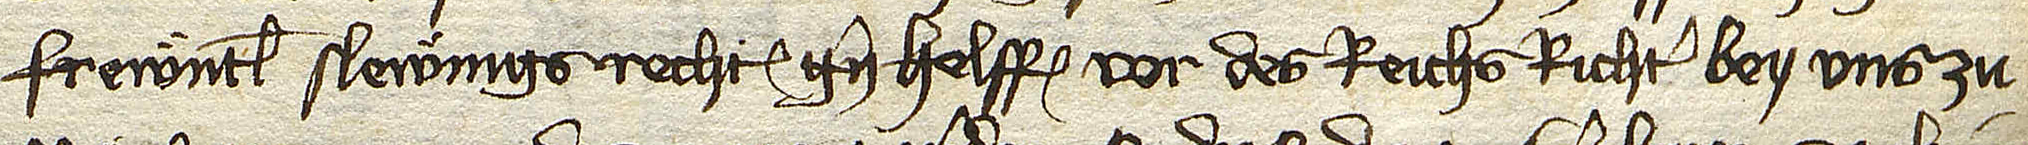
freẅntl* ſleẅnigs recht* g*n helff* vor des Reichs Richt* bey vns ʒu
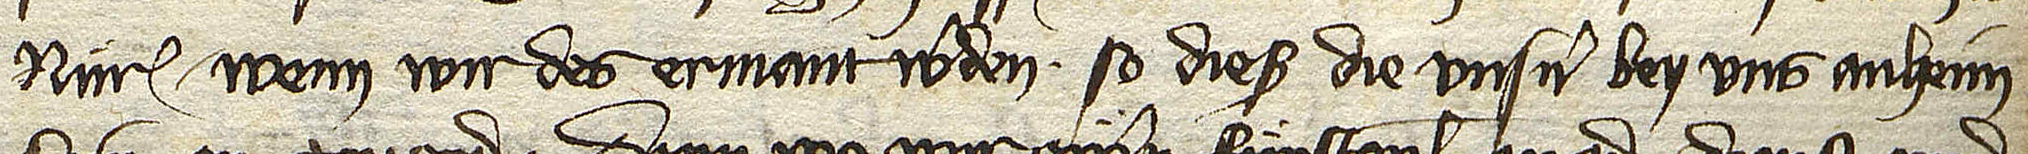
Nür* / wenn wir des ermant w*den . ſo dieſ* die vnſn* bey vns anheim
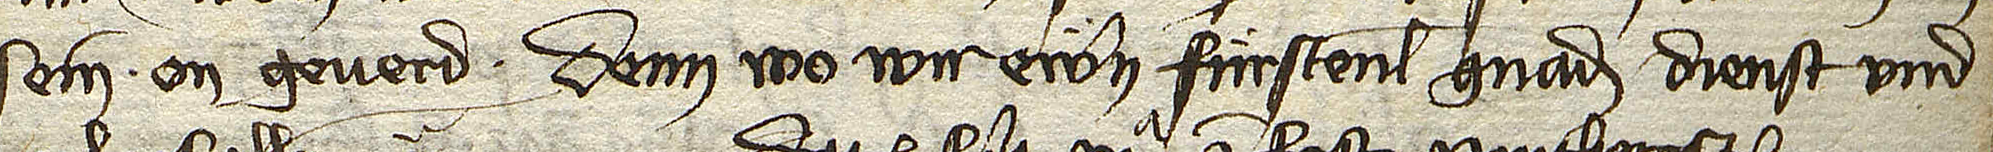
ſein . od geuerd . Denn wo wir eẅ*n fürſtenl* gnad* / dienſt vnd
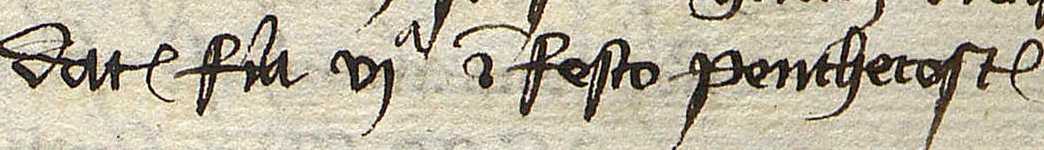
Dat* fi*a vi* i feſto Penthecoſt*
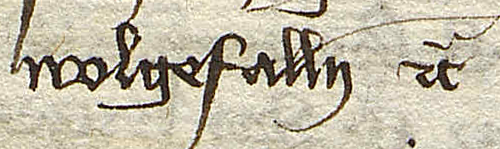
wolgefalln* ec*
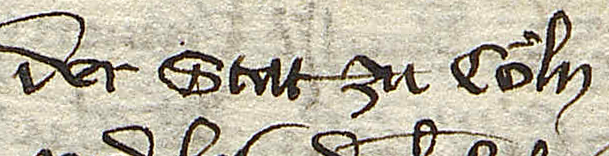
Der Stat ʒu Cöln
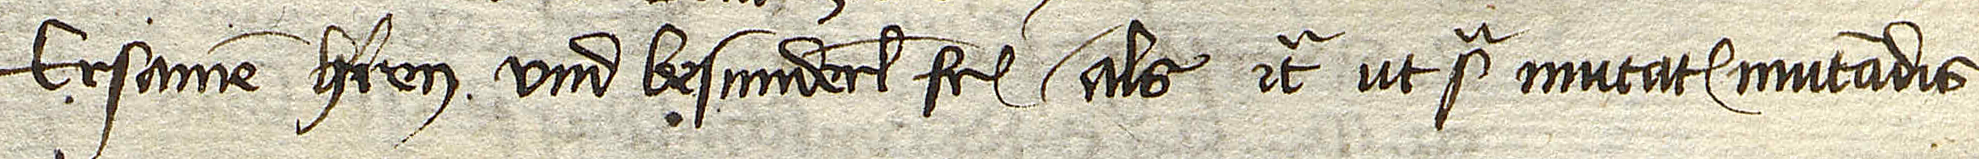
Erſame h*ren vnd beſunderl* fr* / als ec* ut ſ* mutat* muta*dis
